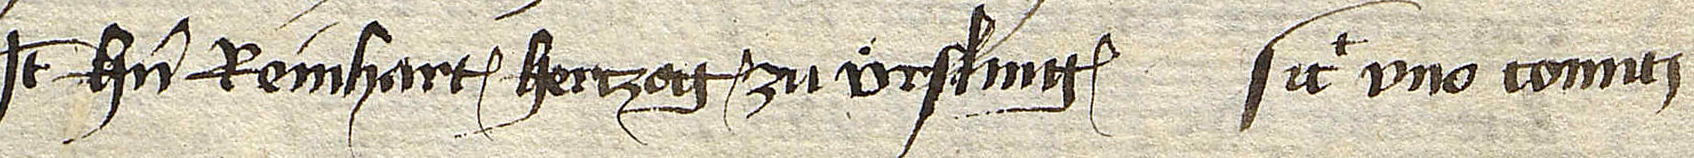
It* hn* Reinhart* hercʒog* ʒu v̈rſling* ſic* vno comiti
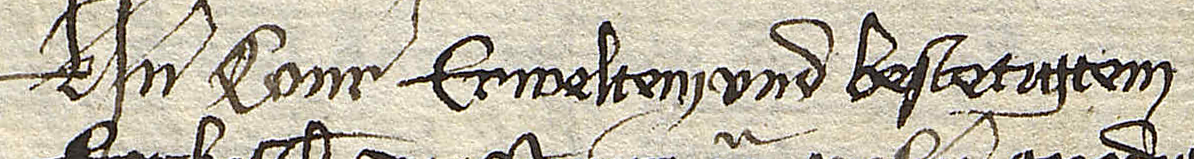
Hn* Conr* Erwelten vnd beſtetigtem
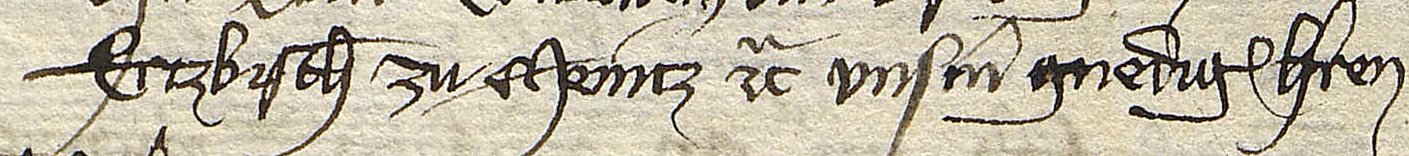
Ercʒbiſch* ʒu Meincʒ ec* vnſm* gnedig* h*ren
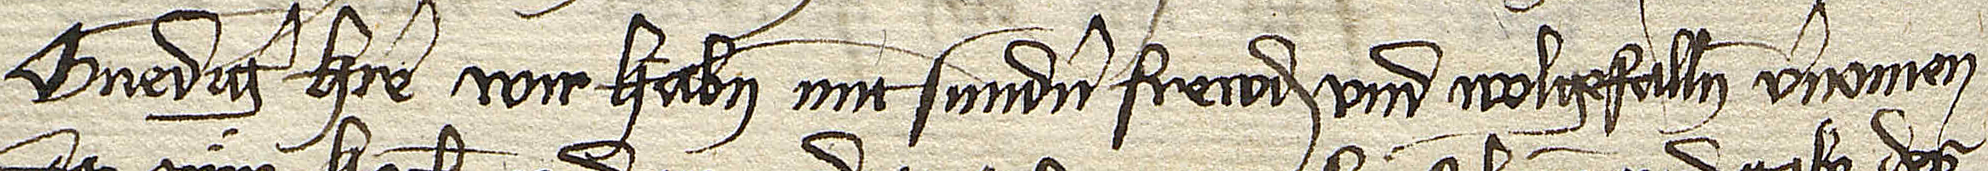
Gnedig* h*re wir habn* mit ſundn* frewd* vnd wolgefalln* v*nomen
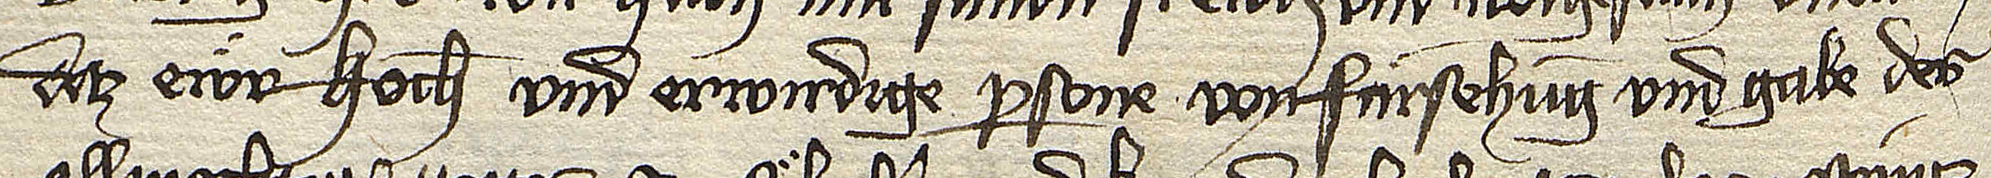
Daʒ eẅr hoch* vnd erwirdige p*ſone von fürſehu*g vnd gabe des
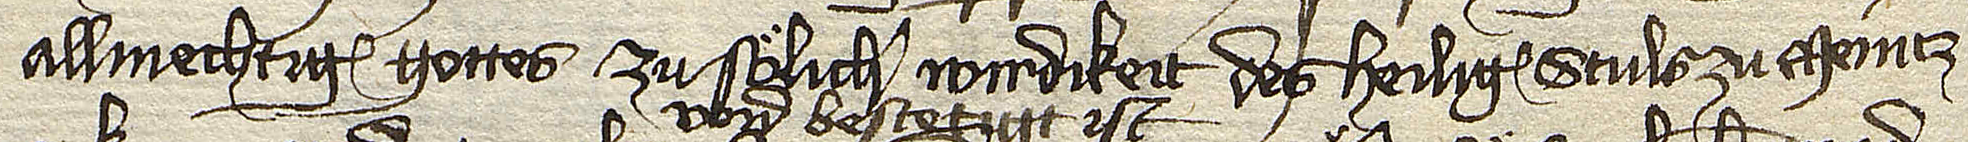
allmechtig* gottes ʒu ſölich* wirdikeit des heilig* ſtuls ʒu Meincʒ
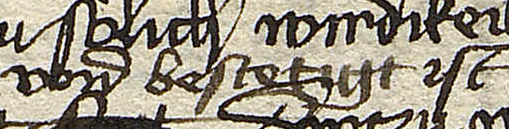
vnd beſtetigt iſt
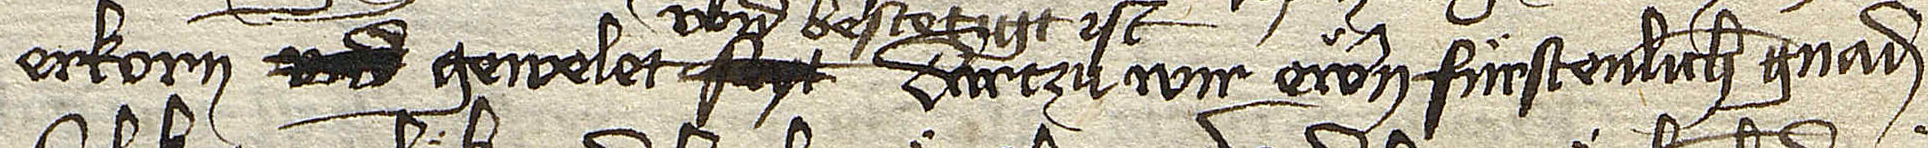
erkorn vnd gewelet ſeyt Darcʒu wir eẅ*n fürſenlich* gnad*
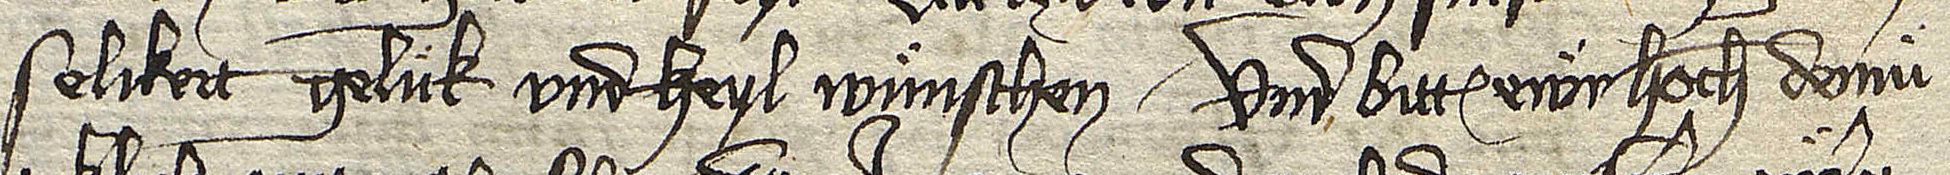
ſelikeit gelük vnd heyl wünſchen / Vnd bitt* eẅr hoch* demü
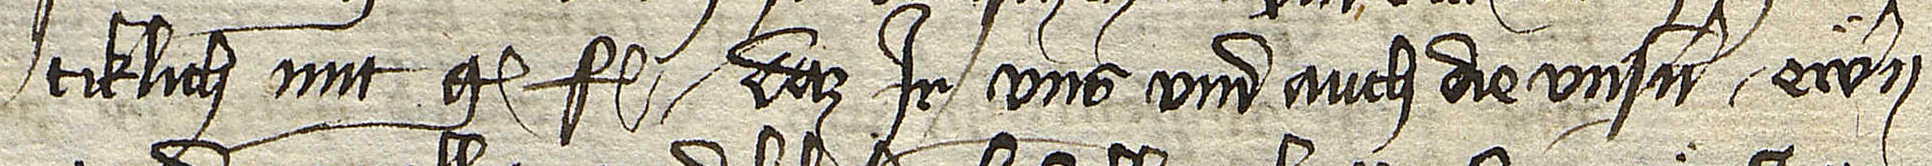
tiklich mit g* f* / Daʒ Ir vns vnd auch die vnſn* / eẅ*n
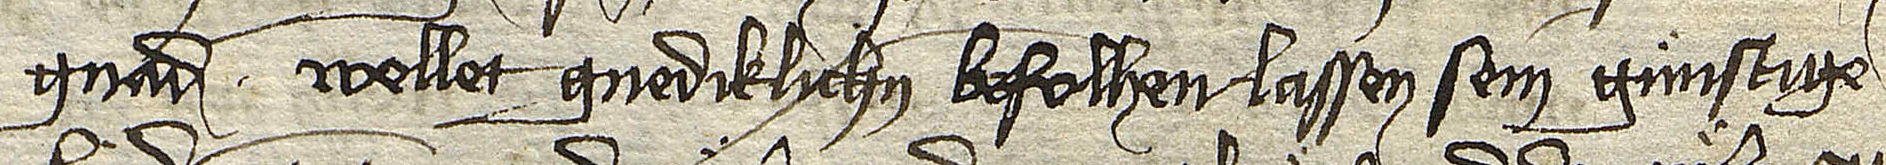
gnad* wellet gnediklichn* befolhen laſſen ſein günſtige
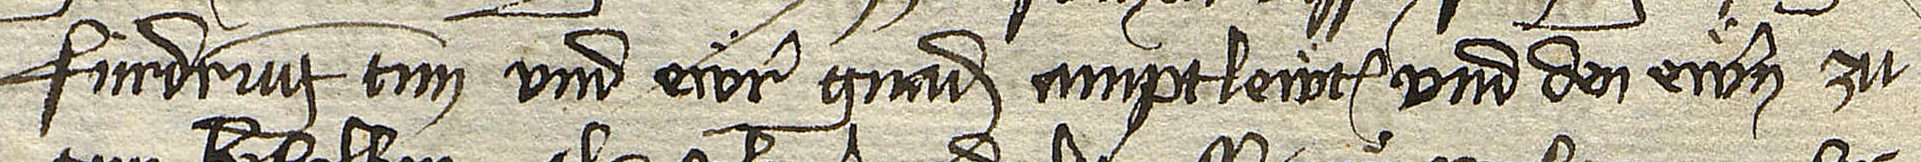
fürdru*g tun vnd eẅr* gnad* amptleẅt* vnd den eẅ*n ʒu
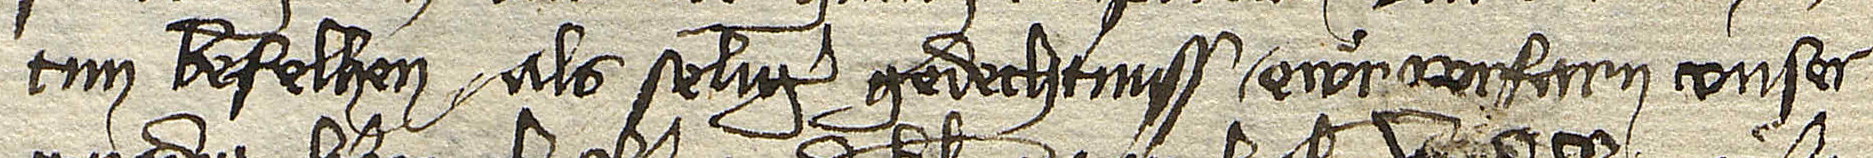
tun befelhen / als ſelig* gedechtnuſſ / eẅr vorfarn vnſer
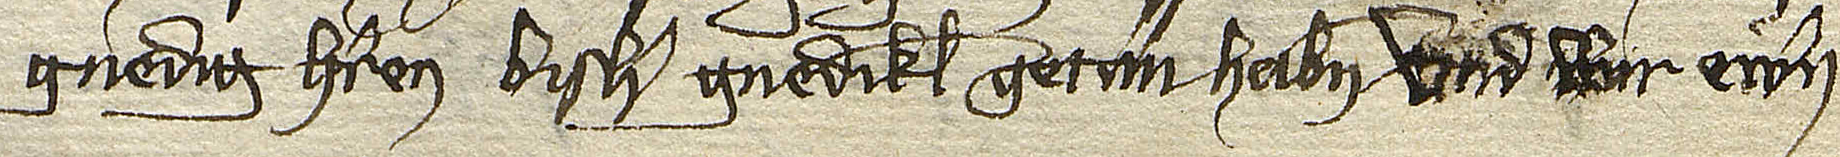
gnedig h*ren biſh* gnedikl* getan habn* Vnd wir eẅ*n
